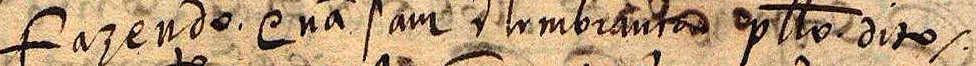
fazendo. e nā sam ē lembrança p̄llo dito /.
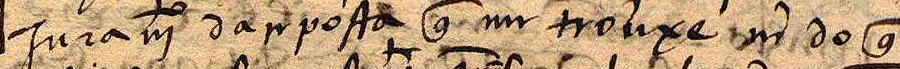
Juramto da reposta q̄ me trouxe nē do q̄
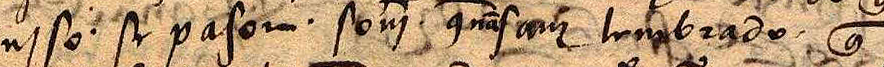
njso se pasou. somte q̄ nā sam lembrado. q̄
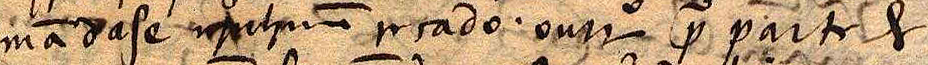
mādase njnhuū recado. outro p̄o parte de
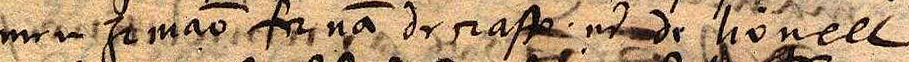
meu Jrmão fernā de crasto. nē de lionell
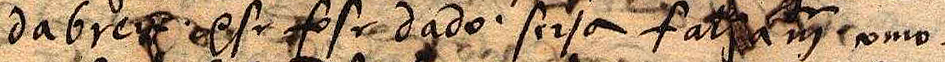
dabreu e se fose dado. serja falsamte como
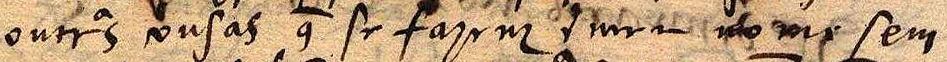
outras cousas q̄ se fazem ē meu nome sem
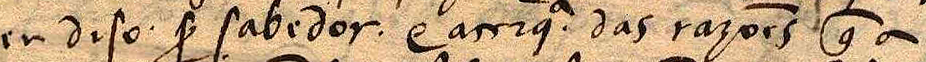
eu diso ꞩ sabedor. e acerqa. das razões q̄ a
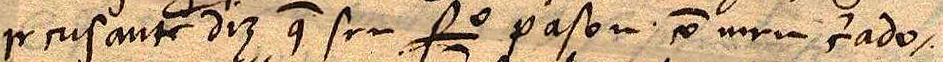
recusante diz q̄ seu fo pasou c̄o meu ciado /.
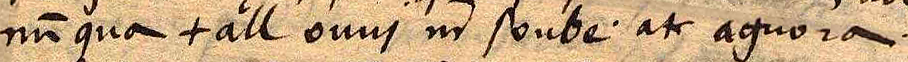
nūqua tall ouuj nē soube. ate aguora
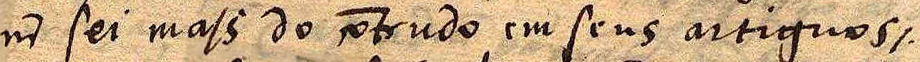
nē sei majs do c̄oteudo em seus artiguos /.
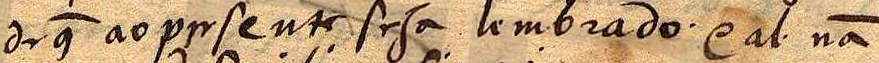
de q̄ ao presente seJa lembrado. e al nā
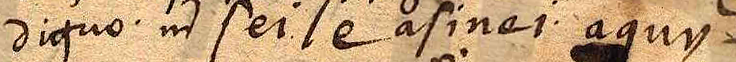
diguo. nē sei / e asinei aquy
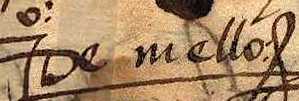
Jo de mello
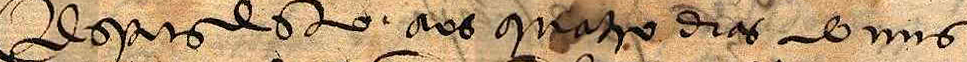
E despois desto aos quatro dias do mes
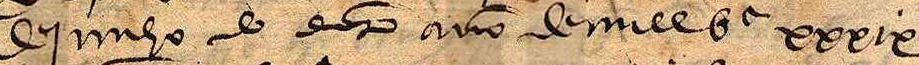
de junho do dito ano de mill bc xxxix
